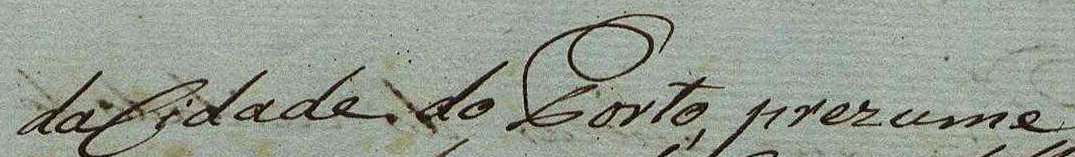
da Cidade do Porto, prezume
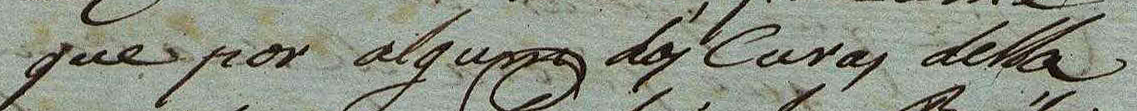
que por algum dos Curas della
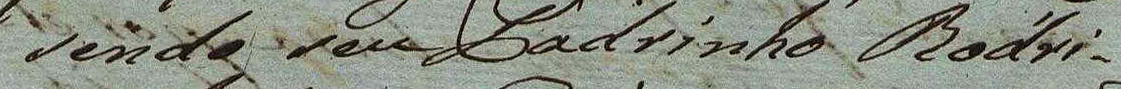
sendo seu Padrinho Rodri
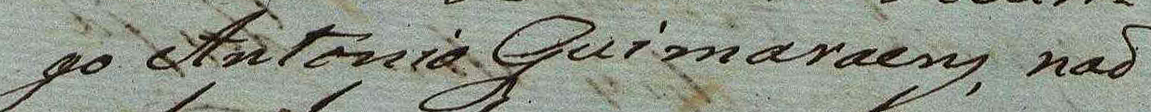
go Antonio Guimaraens, naõ
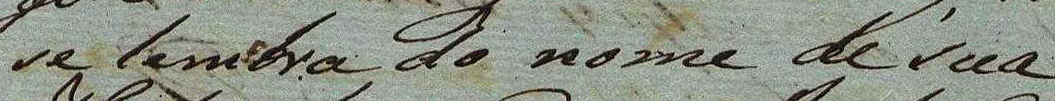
se lembra do nome de sua
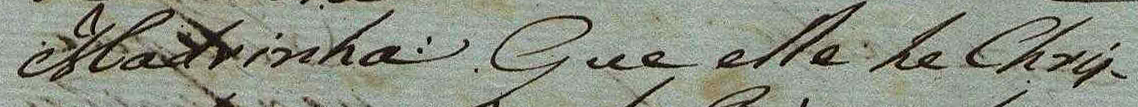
Madrinha: Que elle he Chris
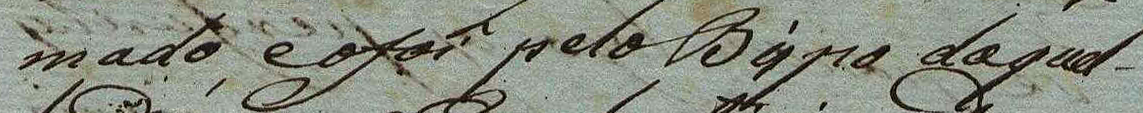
mado, e o foi pelo Bispo daquel
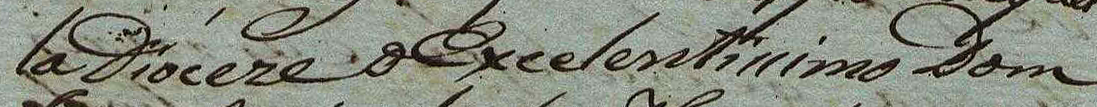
la Dioceze o Excelentissimo Dom
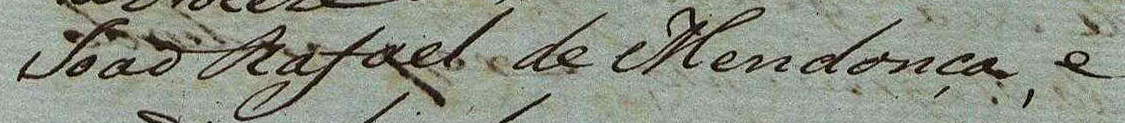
Ioaõ Rafael de Mendonça, e
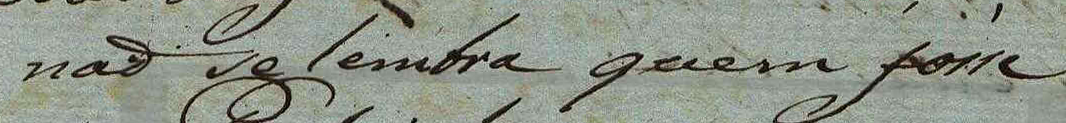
naõ se lembra quem fosse
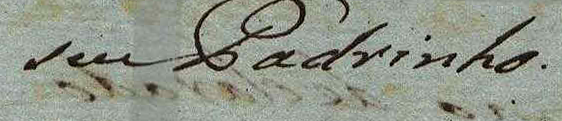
seu Padrinho.
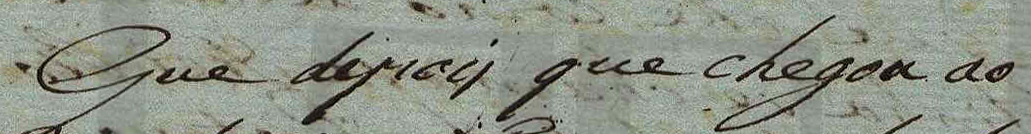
Que depois que chegou ao
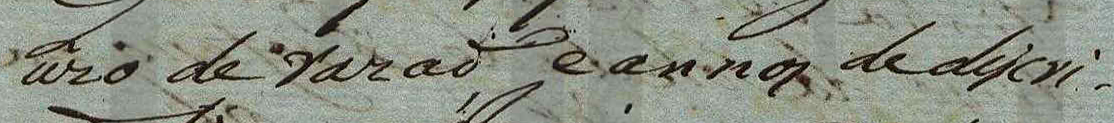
uzo de razaõ e annos de discri
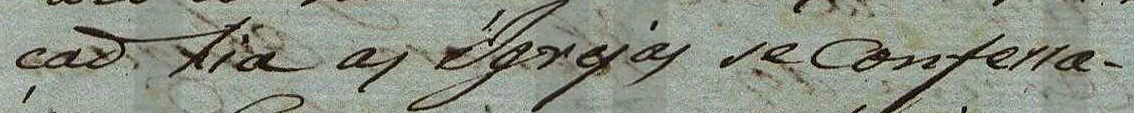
çaõ hia as Igrejas se confessa
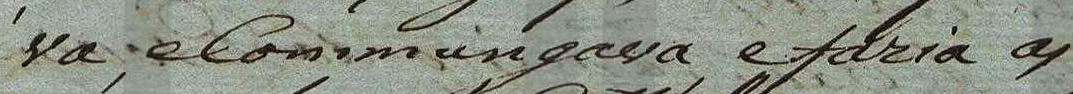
va e Commungava, e fazia as
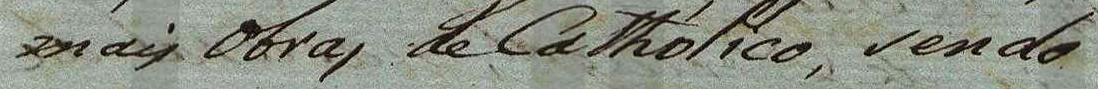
mais obras de Catholico, sendo
